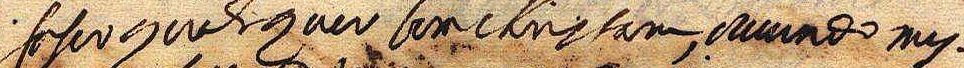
faser qualquer bom christam, ouuindo mis
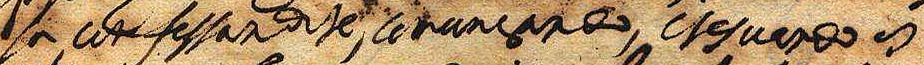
sa, confessandose, comungando, e jejuando os
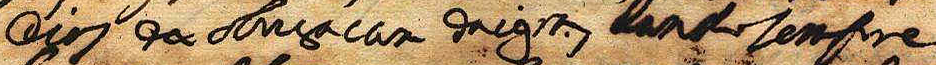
dias da obrigacam da igra., dando sempre
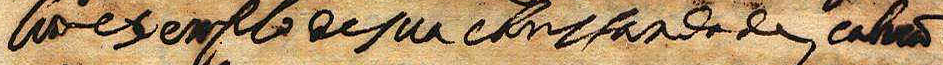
bom exemplo de sua christandade, e al naõ
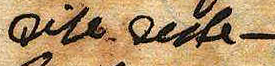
dise deste –
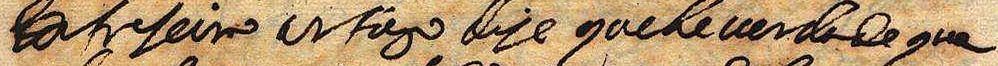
E ao treseiro artigo dise que he uerdade que
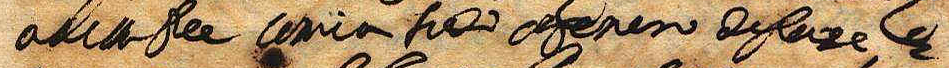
a ditta Ree comia todo o genero de peixe, E
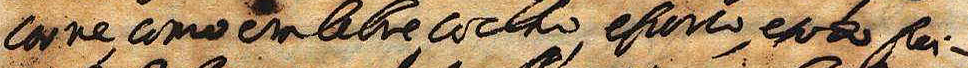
carne, como era lebre coelho, e porco, e todo pei
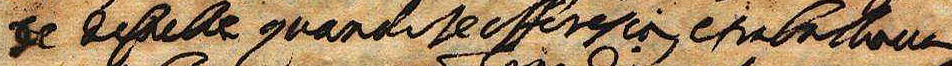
xe de pelle quando se offeresia, e trabalhaua
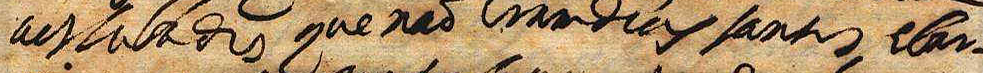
aos sabados que naõ eram dias santos, E bar
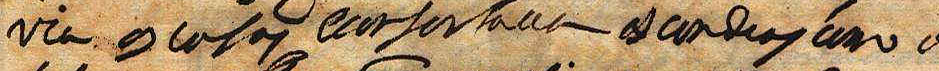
ria as casas e consertaua as candeas como o
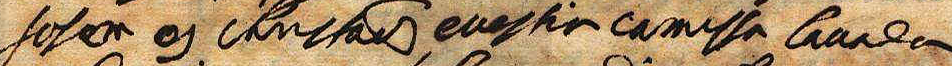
fasem os christaõs e uestia camissa lauada
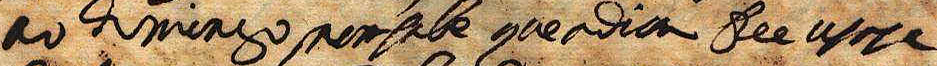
ao domingo, nem sabe que a ditta Ree usase
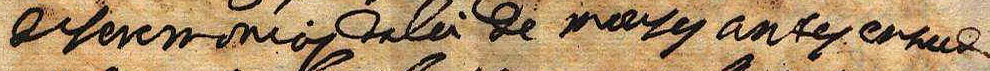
de seremonias da lei de moises antes em tudo
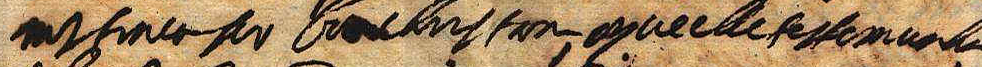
mostraua ser boa christam, o que elle testemunha
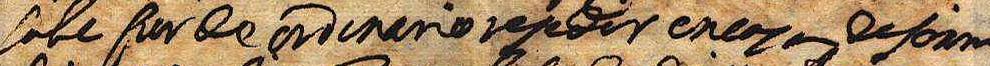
sabe por de ordinario resedir en casa de joam
